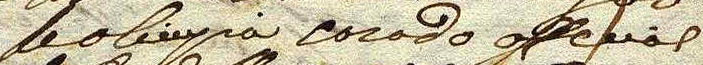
de oliueyra cazado offecial
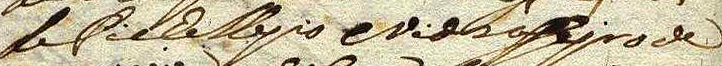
de Pichelleyro e vidrassejro de
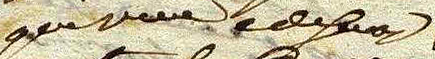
que viue e de suas
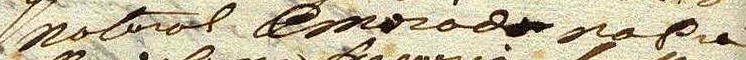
natural e morador na Pra
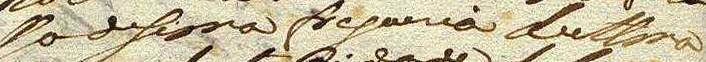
ssa de sima freguezia de Alma
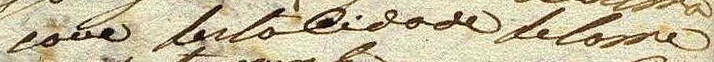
caue desta cidade de Lame
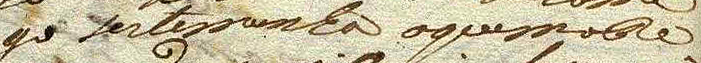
go testemunha a quem o Re
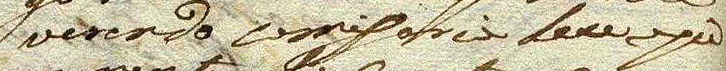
verendo comisario deu o ju
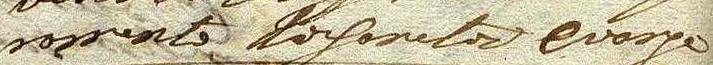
ramento dos sanctos Evange
